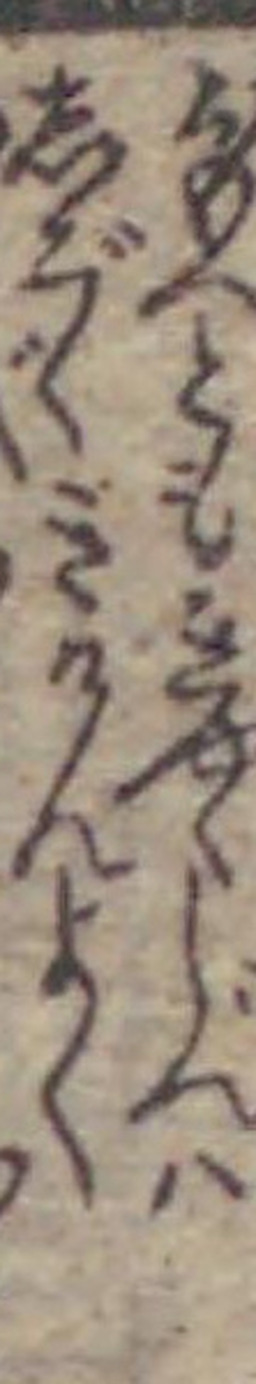しごくきけんよく
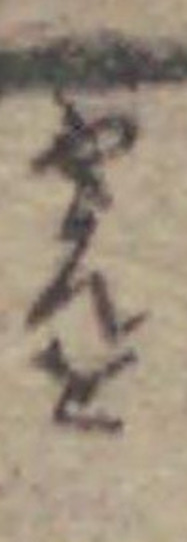やかんを

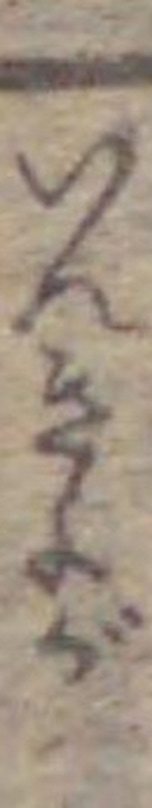いんきよが
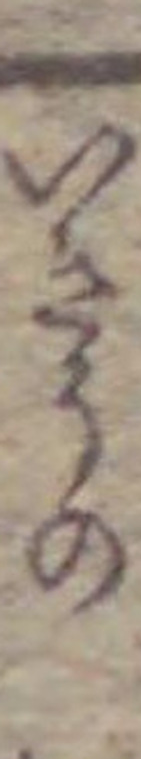いきうの
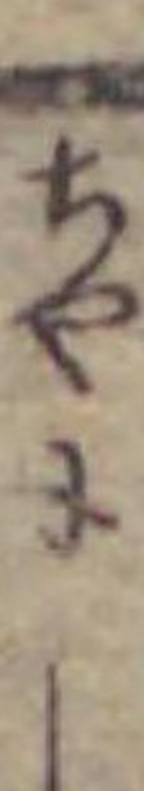ちやに
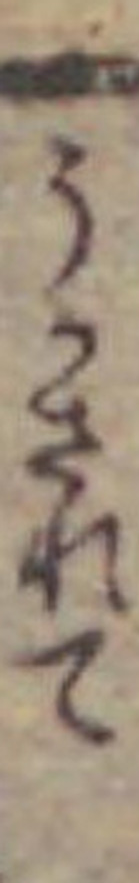うかされて
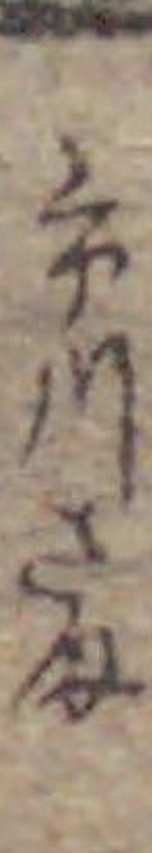市川さま
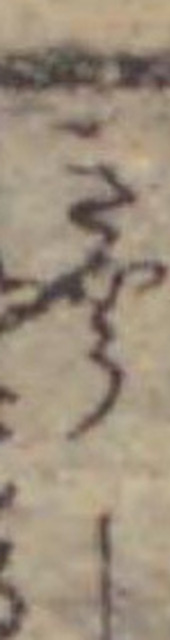きやう
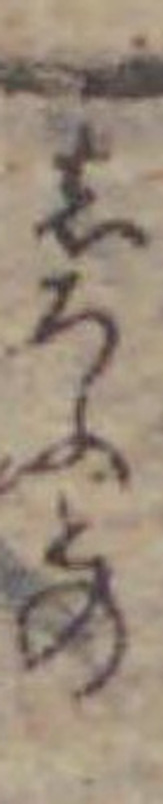しろふとの
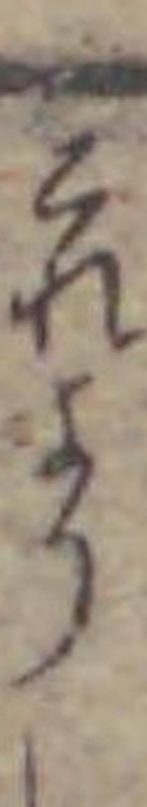これより
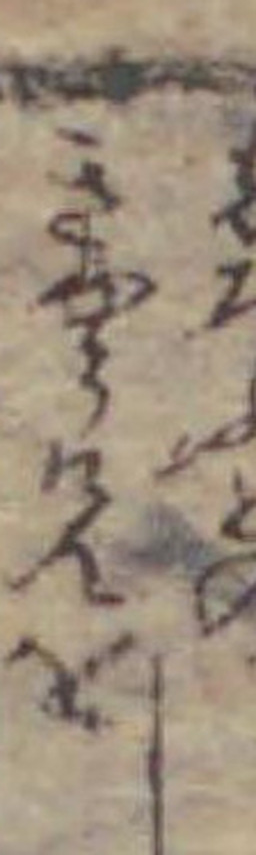きやうけんを
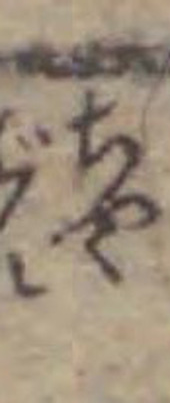ちやに
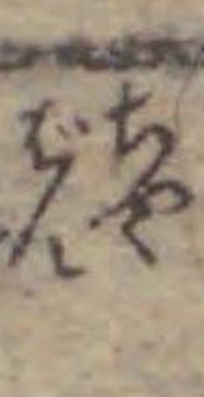ちやに
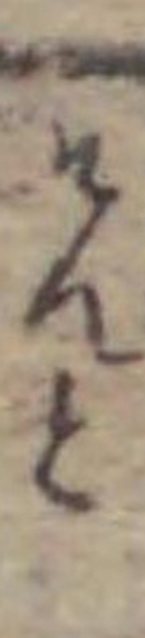けんと

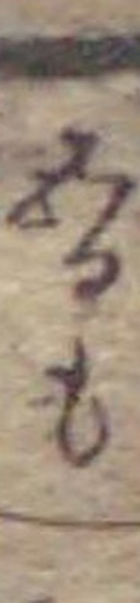五日も
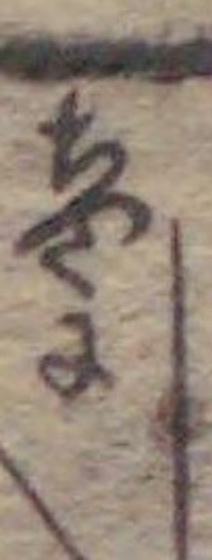ちやに
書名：見通占 : 3巻
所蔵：国立国会図書館 National Diet Library, JAPAN
